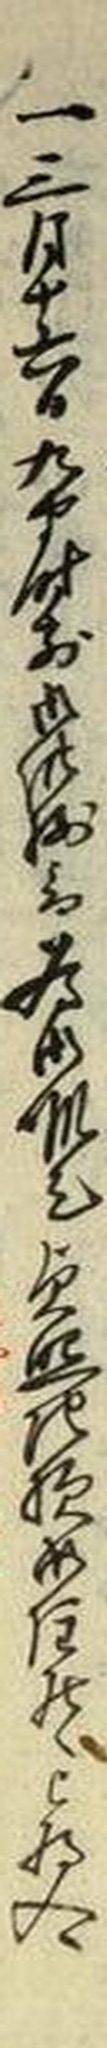一三月十六日九半時前御供揃ニ而為御暇乞貞照院様御住居へ被為入候
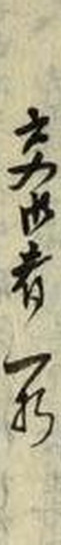交御肴一折
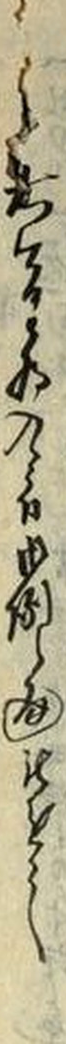右今日被為入候ニ付御例之通被進之
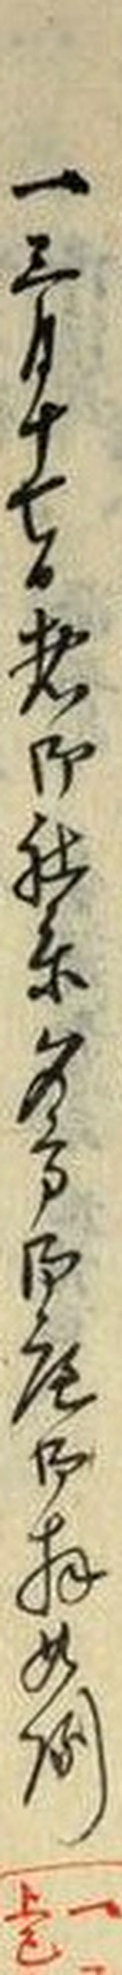一三月十七日惣御社参夕方御庭御拝如例
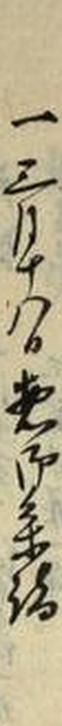一三月十八日惣御参詣
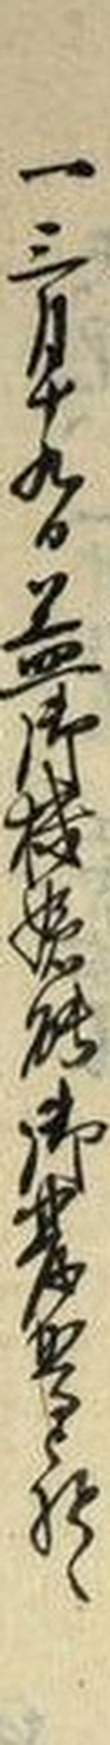一三月十九日益御機嫌能御発駕被遊候

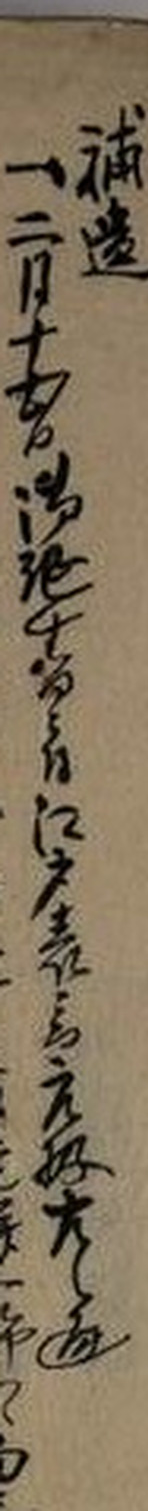一二月十五日御誕生日ニ付江戸表ニ而取扱左之通
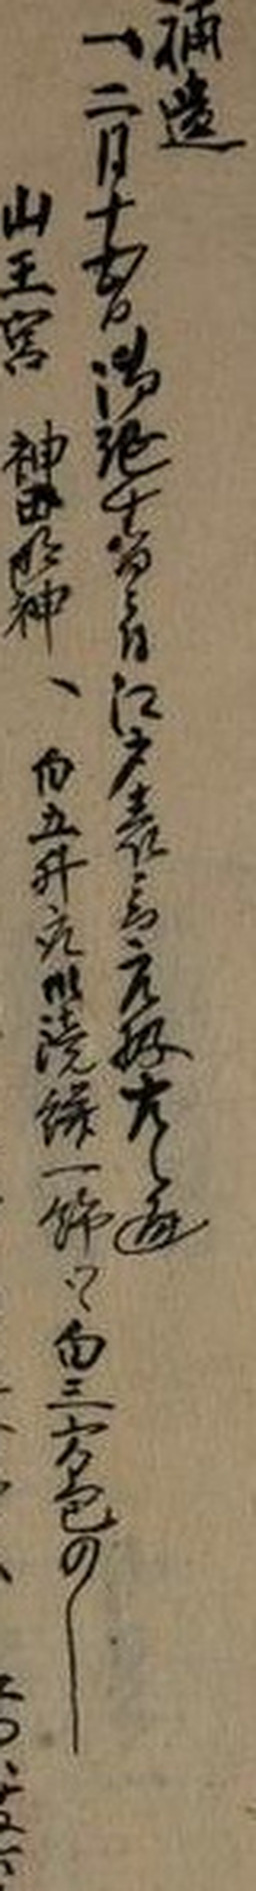山王宮神田明神へ白五升取御鏡餅一飾ツゝ白三方包のし
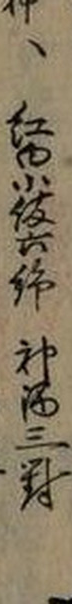紅白小備六飾神酒三対
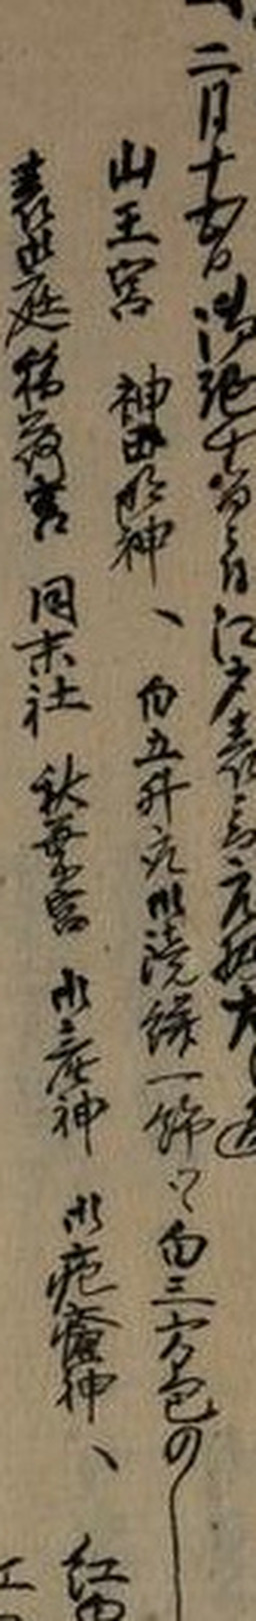表御庭稲荷宮同未社秋葉宮御産神御疱瘡神へ
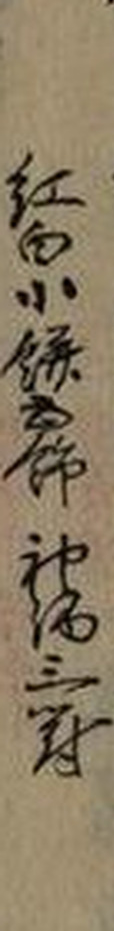紅白小餅五飾神酒三対
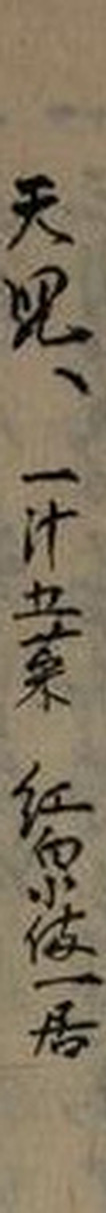天児へ一汁五菜紅白小備一居
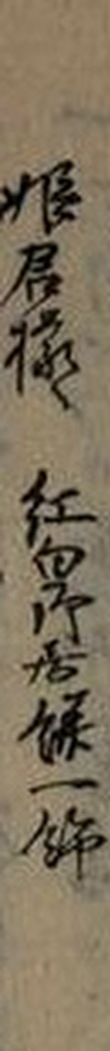姫君様へ紅白御居餅一飾
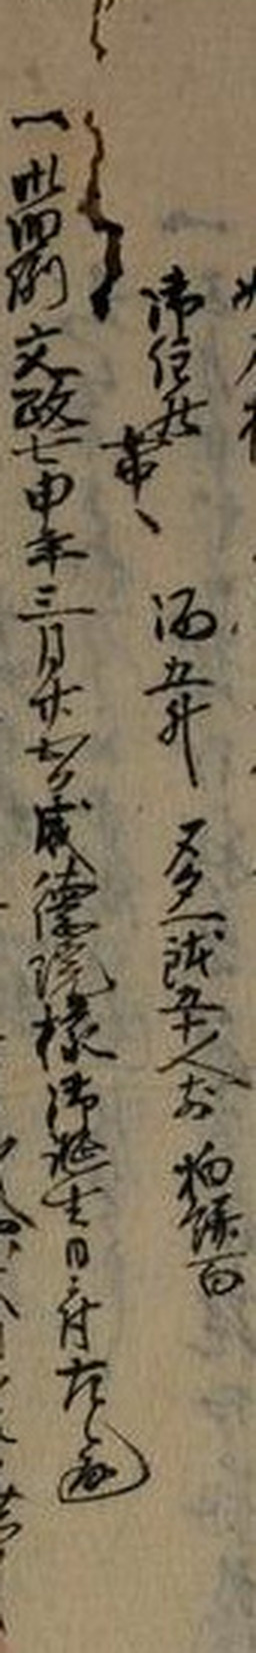一御旧例文政七申年三月廿五日威徳院御誕生日ニ付左之通
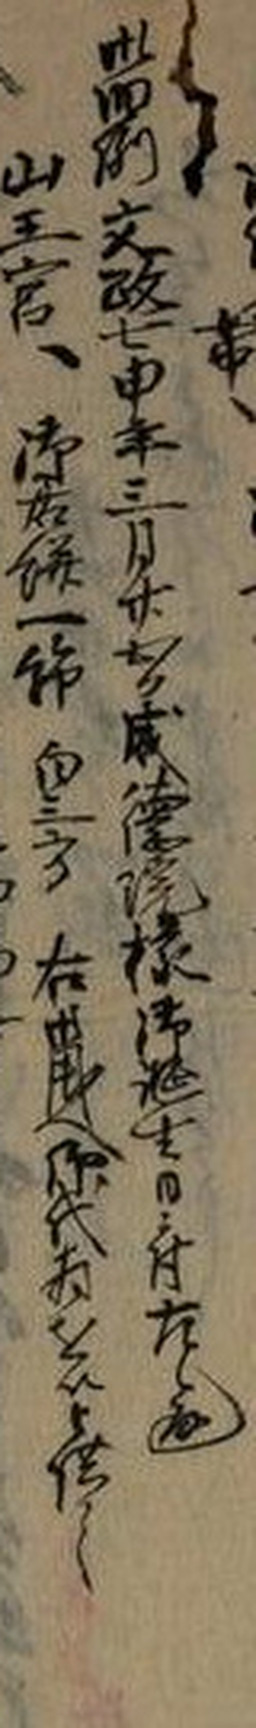山王宮へ御居餅一飾白三方右御用人御代拝を以被供之
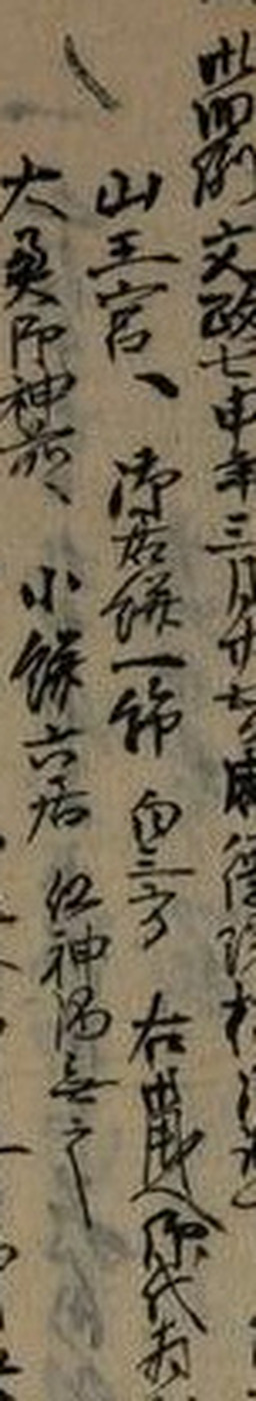大奥御神前へ小餅六居但神酒無之
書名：少傅日録抄（斉承付側向頭取日記、在国）
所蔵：福井県文書館 Fukui Prefectural Archives
